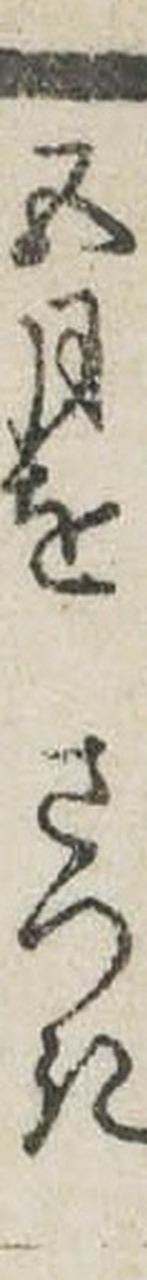五月をさつき
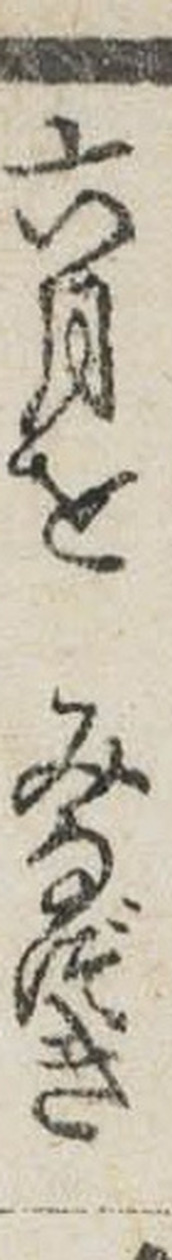六月をみなづき
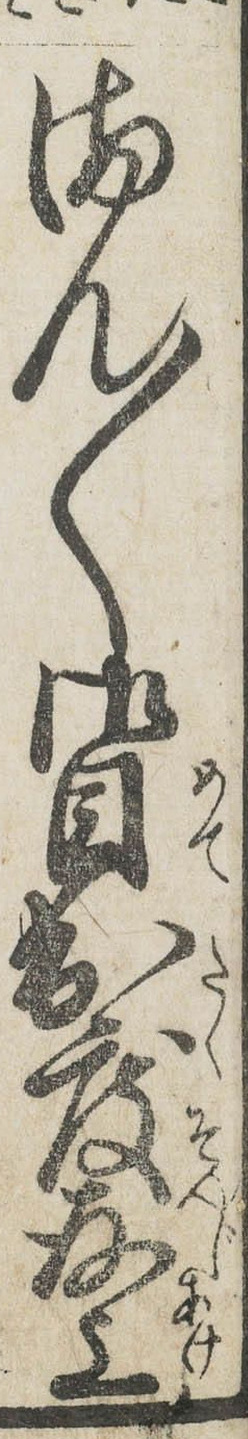まん〳〵御目出度存上
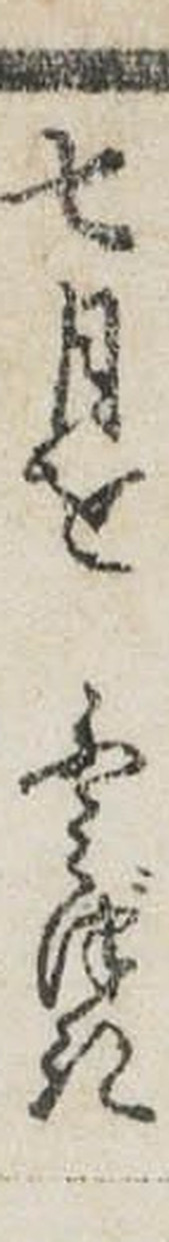七月をふみづき
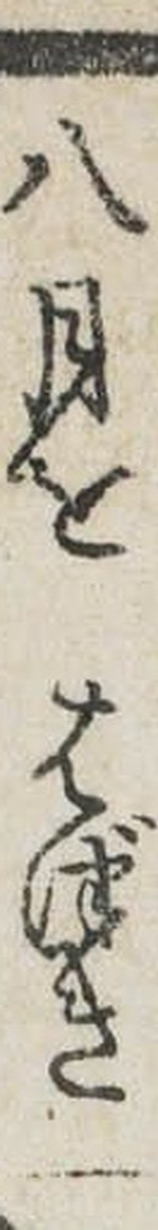八月をはづき
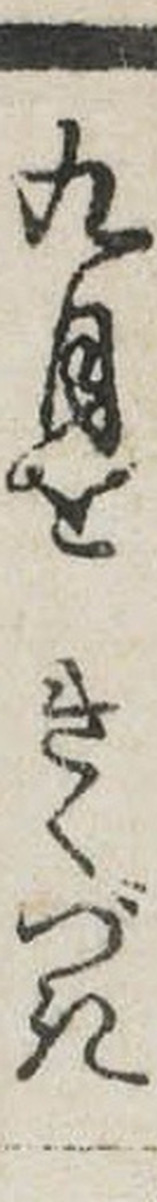九月をきくづき
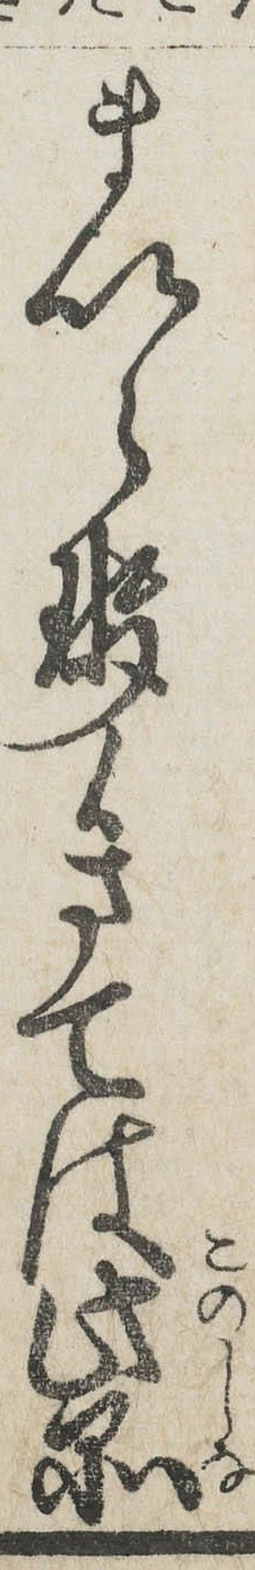まいらせ候さては此品
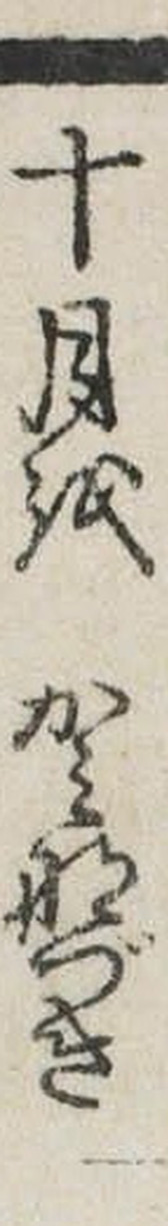十月をかみなづき
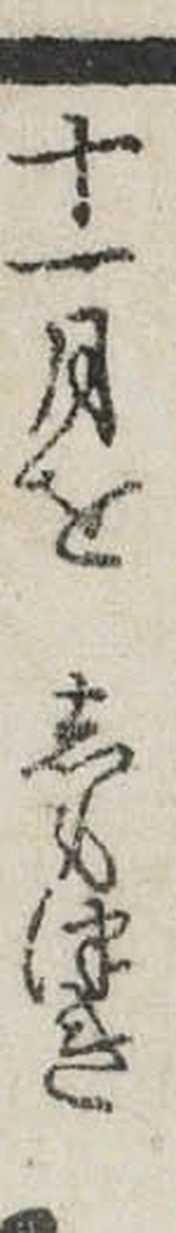十一月をしもつき
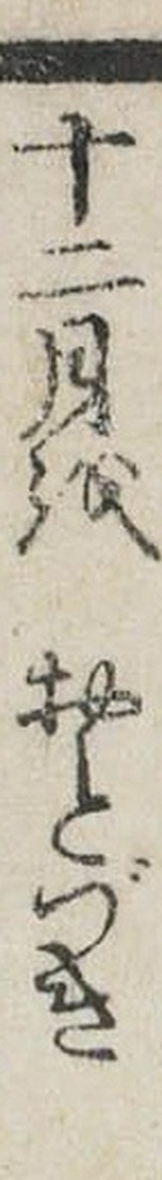十二月をおとづき
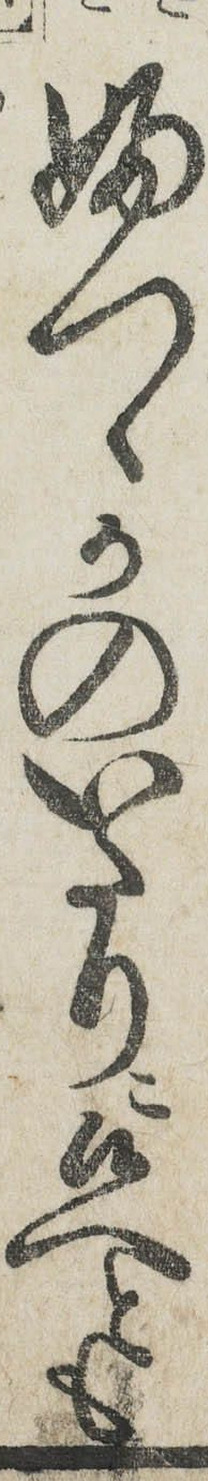ふつゝかのいたりに候へとも
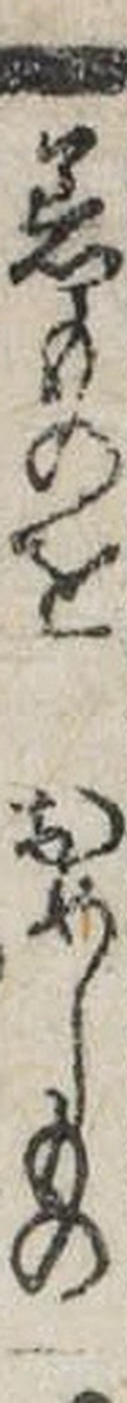着ものをおめしもの
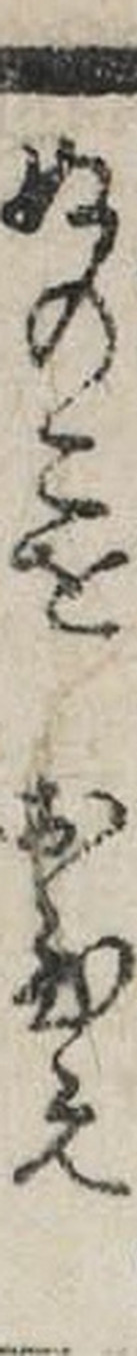ぬのこをおひえ
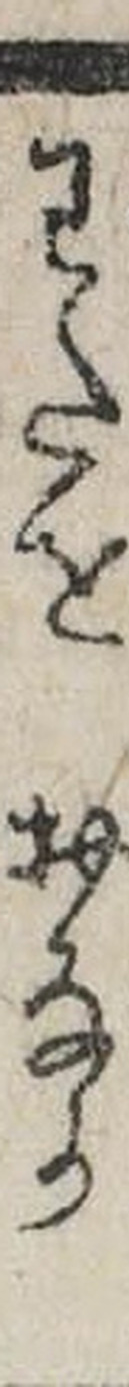わたをおなか
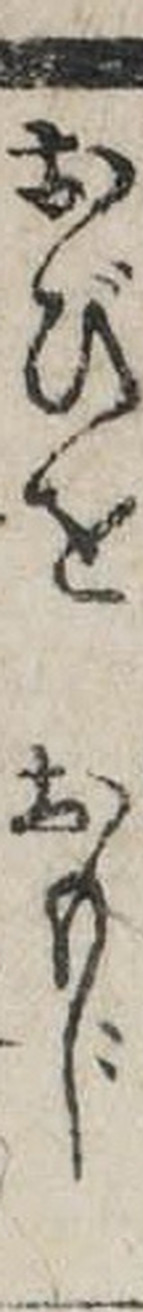おびをおもじ
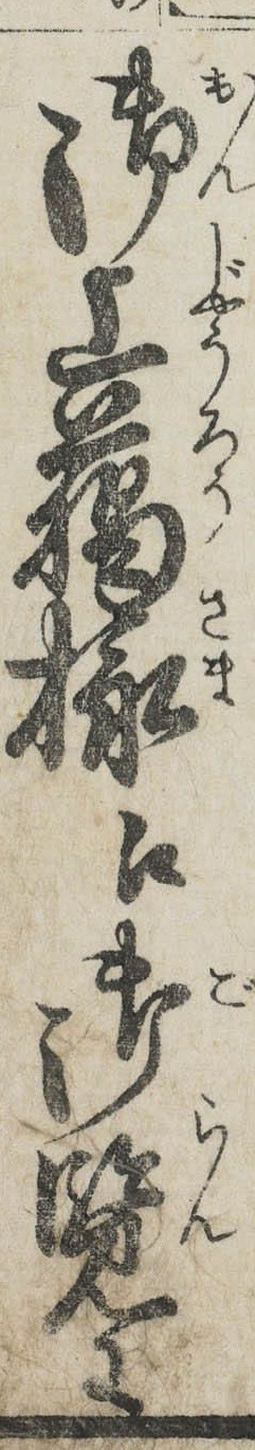御上臈様え御覧に
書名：頭書萬用婦人手紙之文言
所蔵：東京学芸大学教育コンテンツアーカイブ
